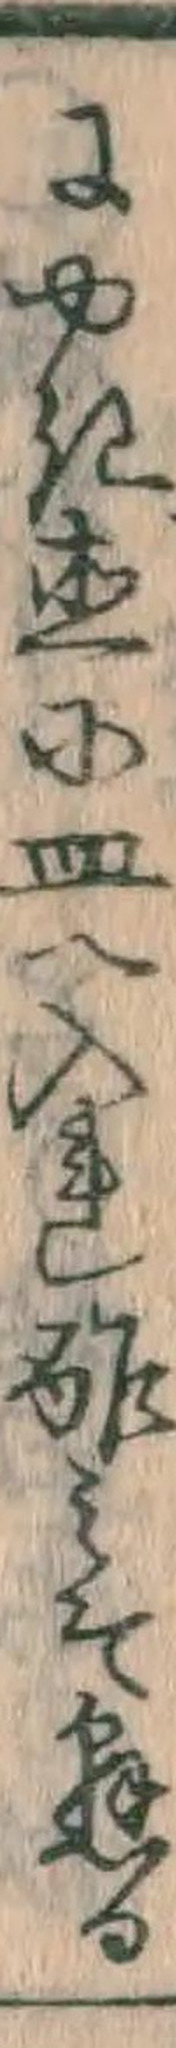にやき直に皿へ入れ酢みそ懸る
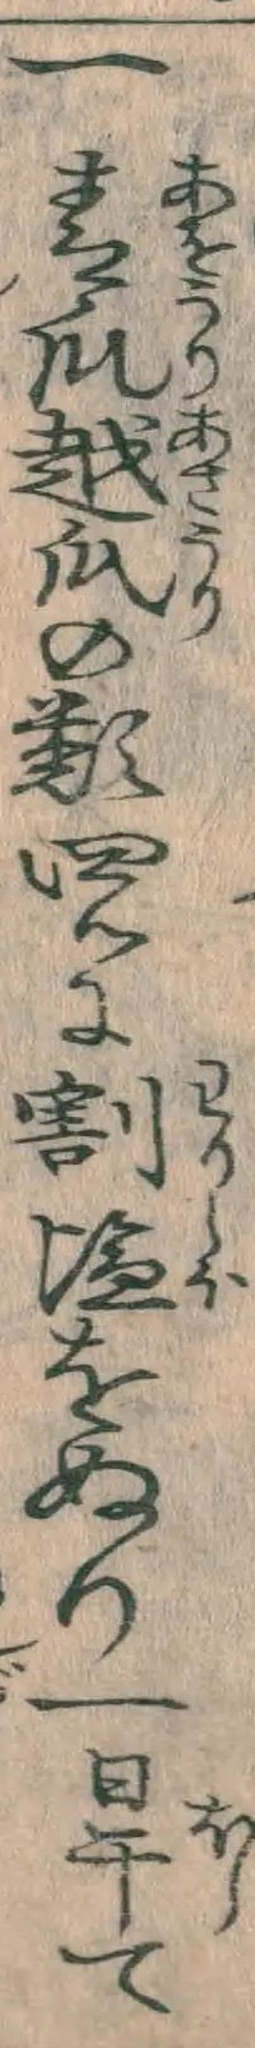一青瓜越瓜の類四ッに割塩をぬり一日干て
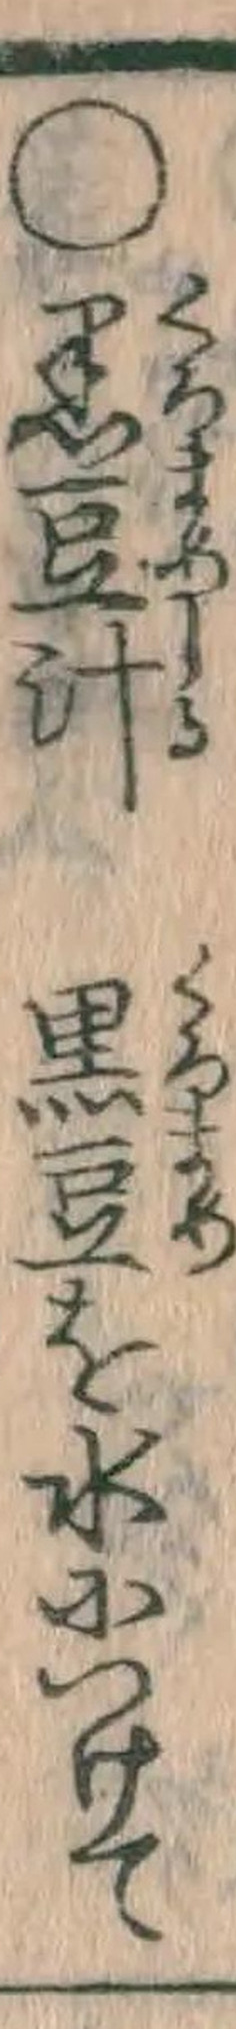○黒豆汁黒豆を水につけて
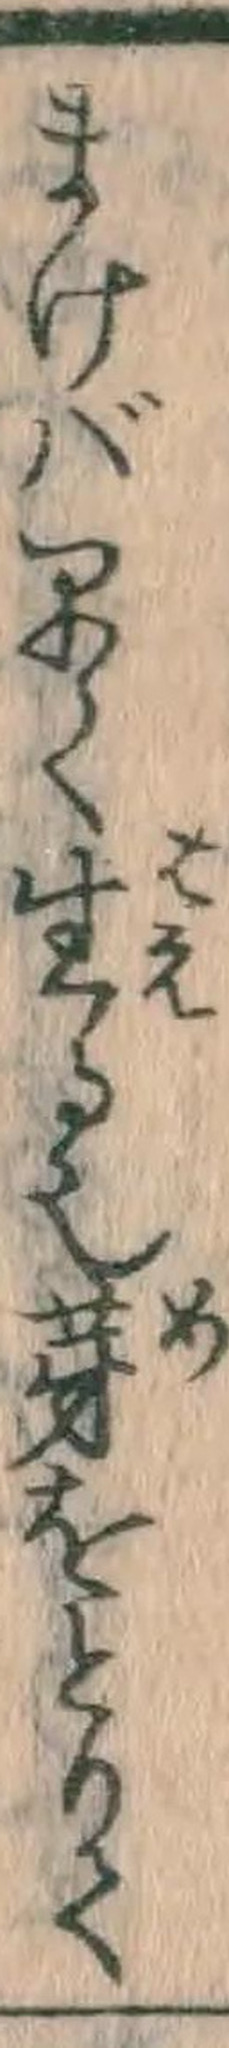まけば早く生る也芽をとりて
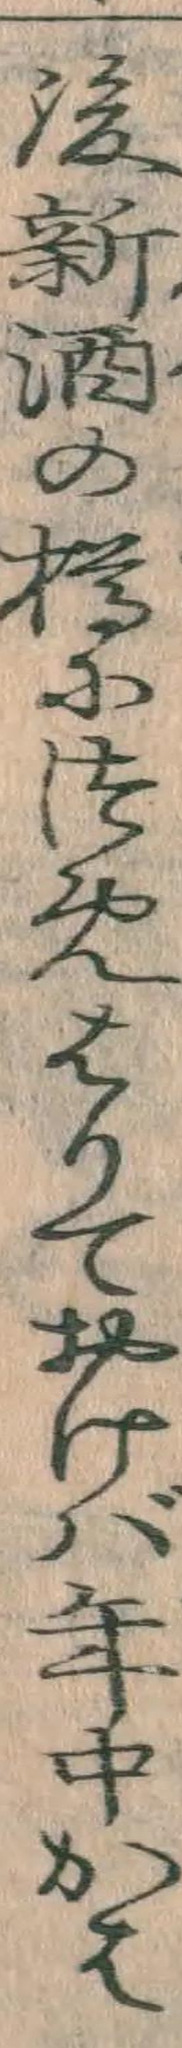後新酒の樽につめはりておけば年中かは
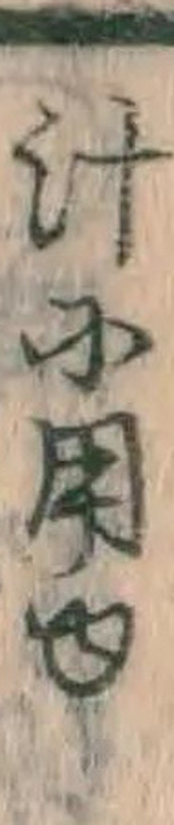汁に用ゆ
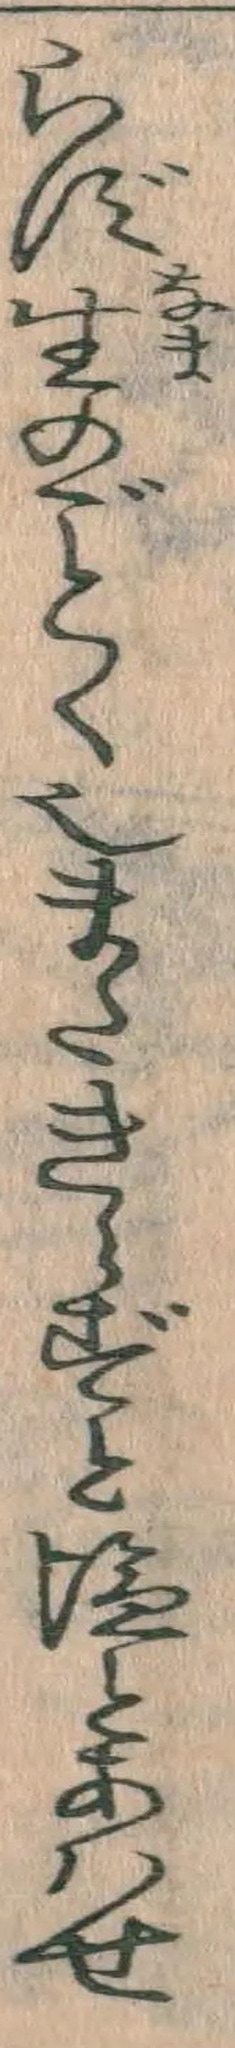らず生のごとく也またきらずと塩とあはせ
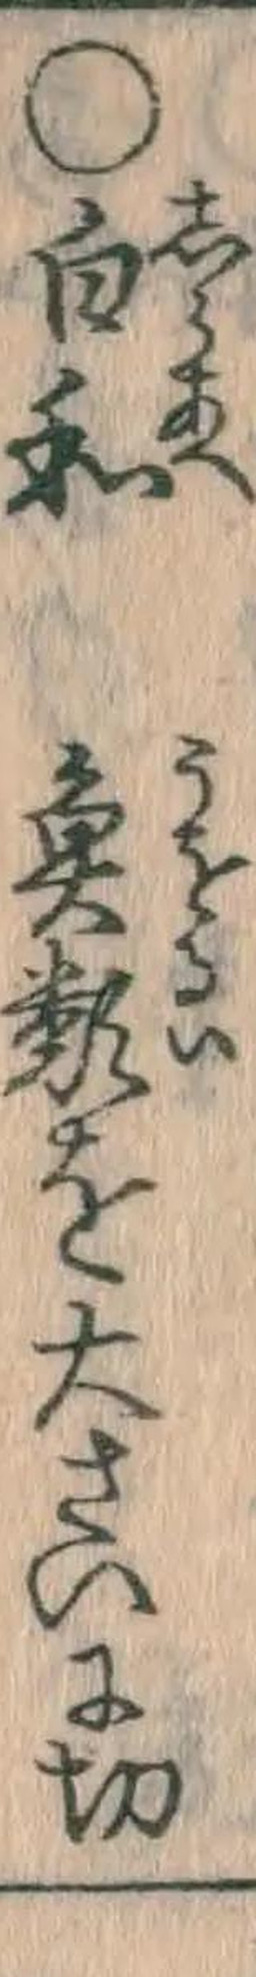○白和魚類を大さいに切
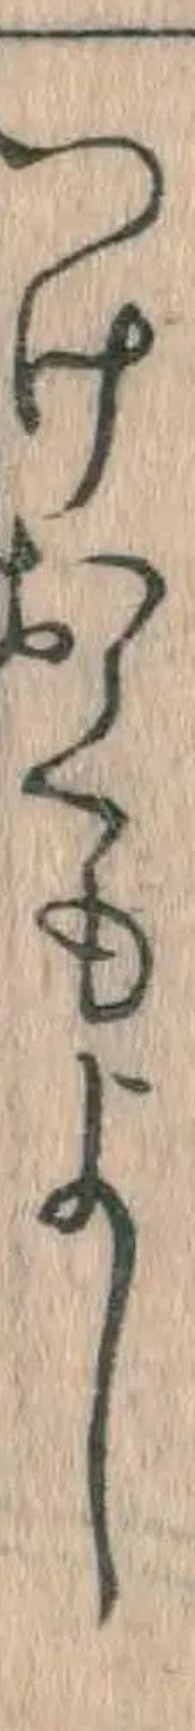つけおくもよし
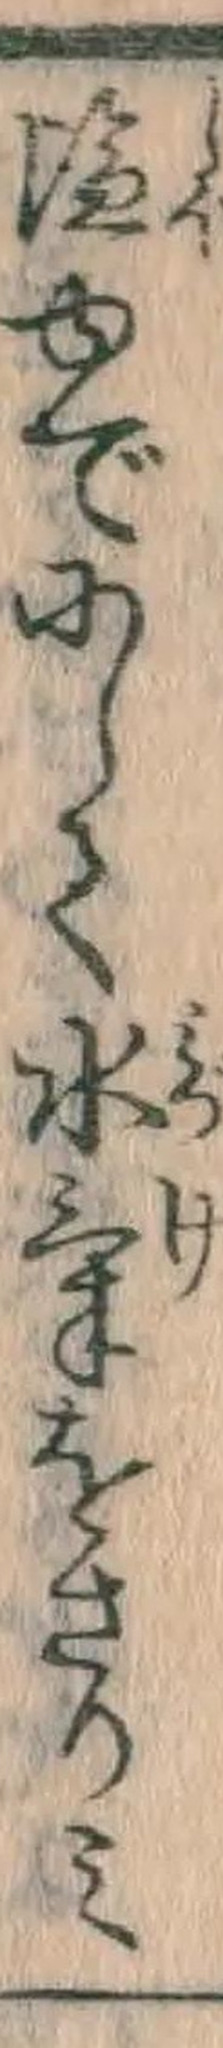塩ゆでにして水気をさりみ
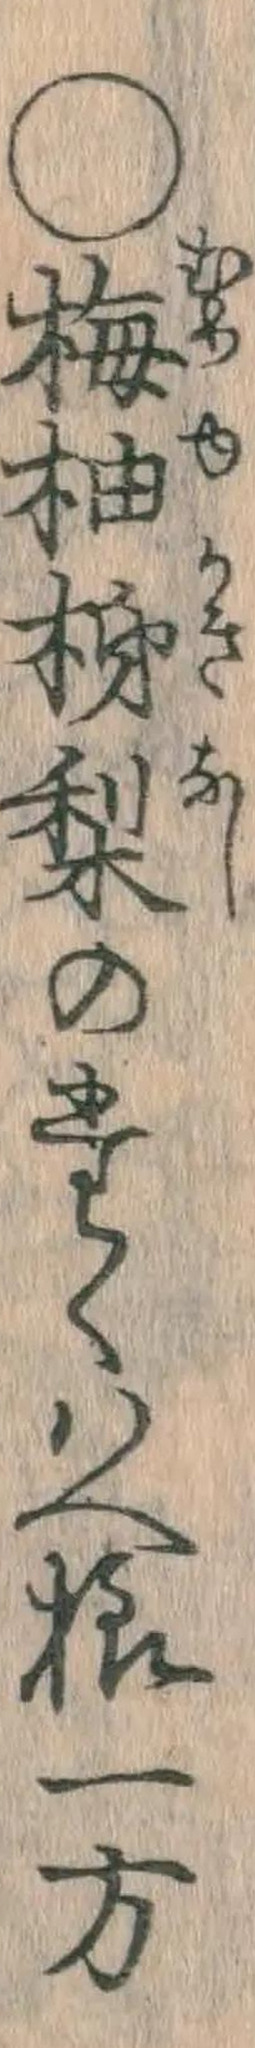○梅柚柿梨のたくはへ様一方
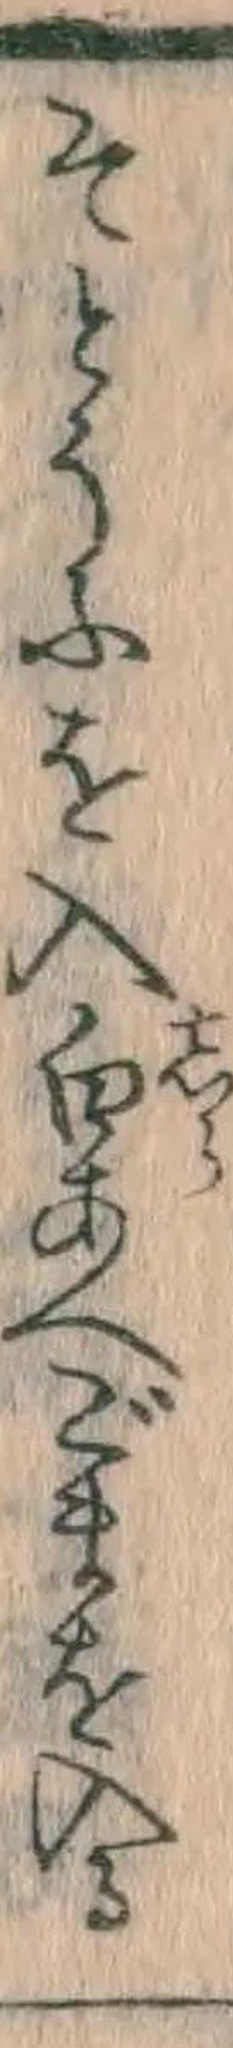そとうふを入白あへごまを入る
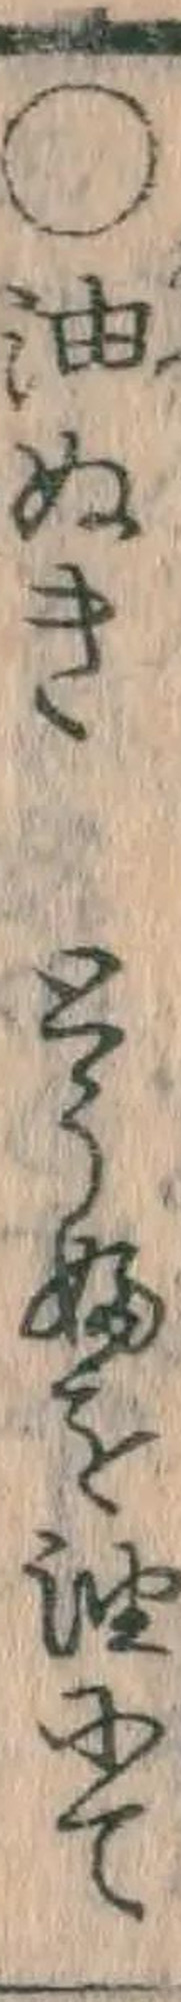○油ぬきとうふを油にて
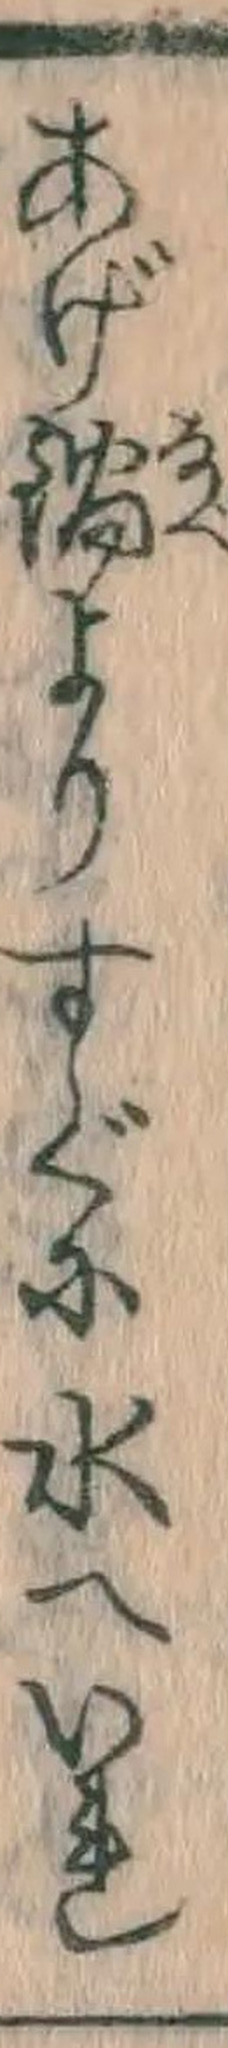あげ鍋よりすぐに水へいれ
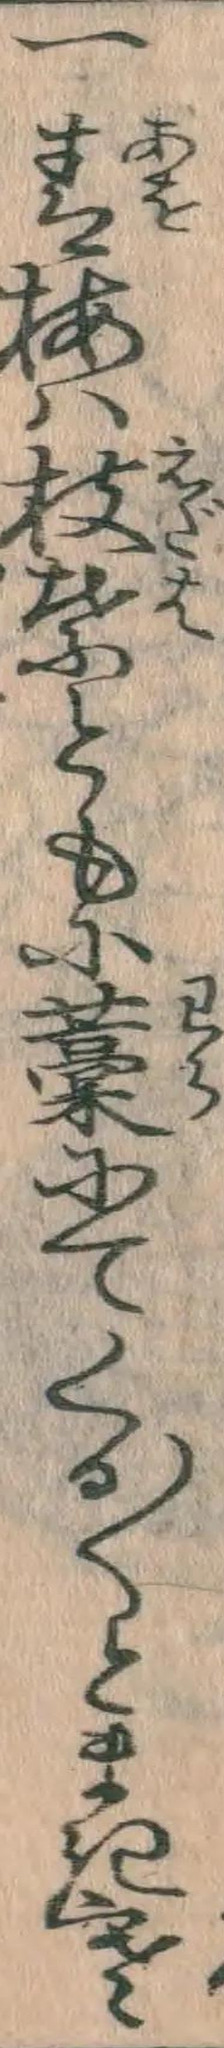一青梅は枝葉ともに藁にてくる〳〵とまき寒
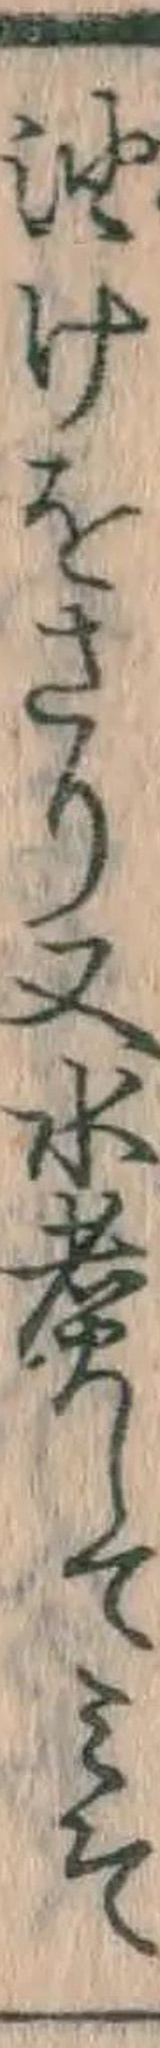油けをさり又水煮してみそ
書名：広益秘事大全 3巻. [5]
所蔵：国立国会図書館 National Diet Library, JAPAN
